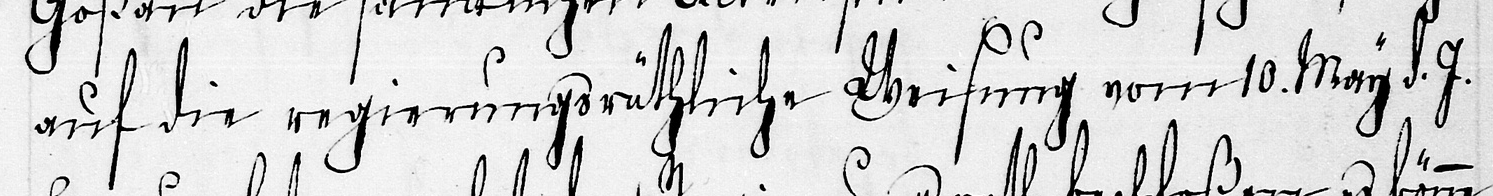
auf die regierungsräthliche Weisung vom 10. May d. J.
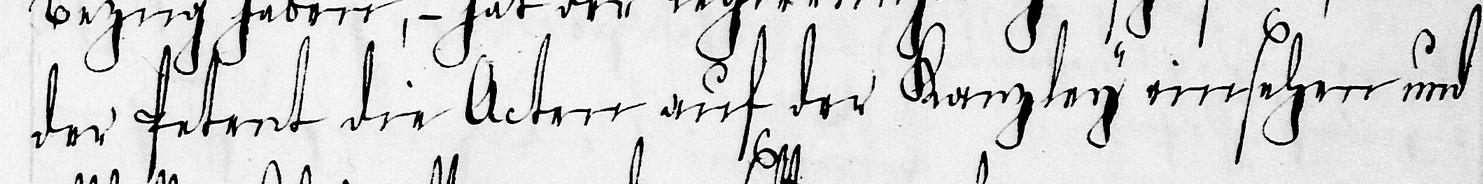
der Petent die Acten auf der Kanzley einsehen und
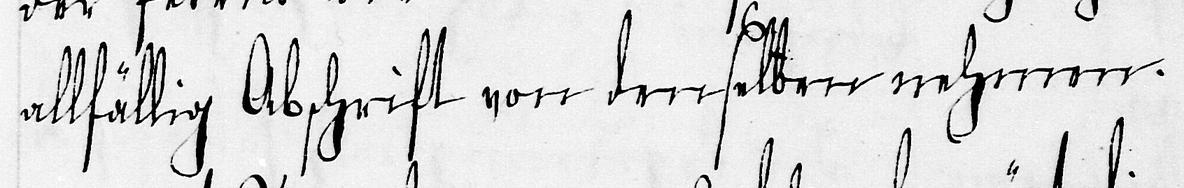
allfällig Abschrift von denselben nehmen.
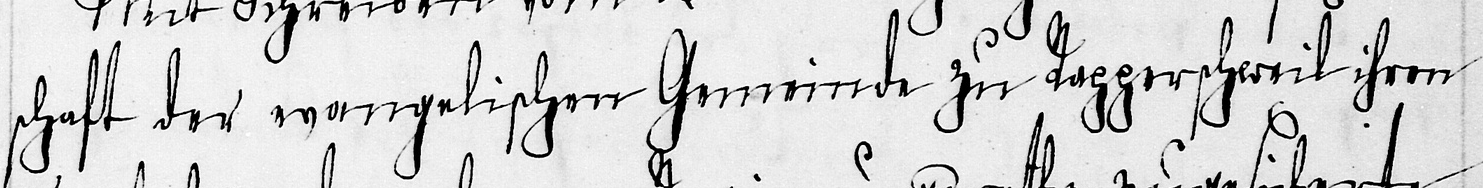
chaft der evangelischen Gemeinde zu Rapperschweil ihren
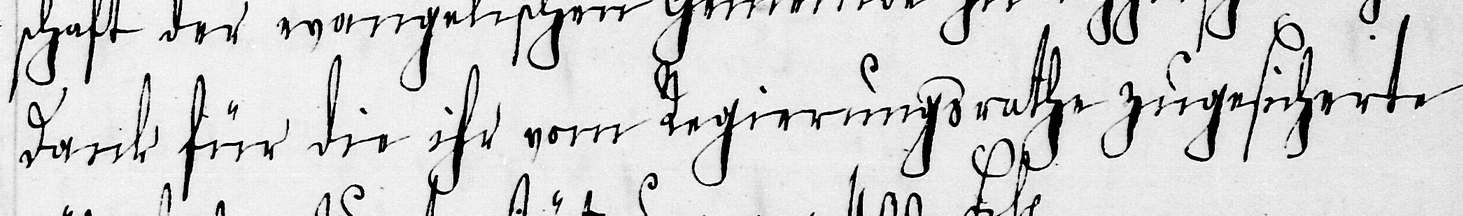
Dank für die ihr vom Regierungsrathe zugesicherte
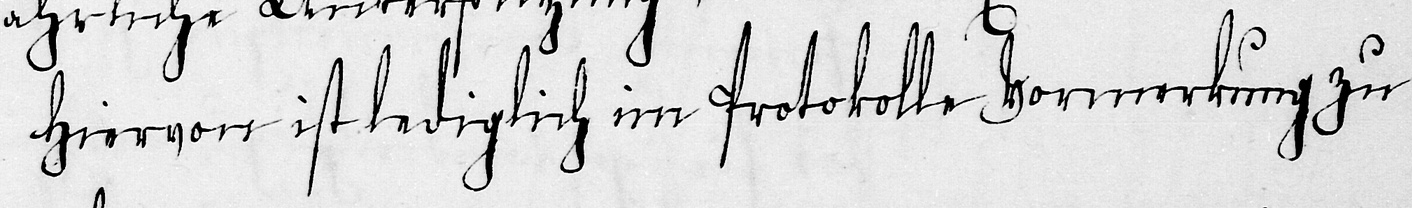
Hiervon ist lediglich im Protokolle Vormerkung zu
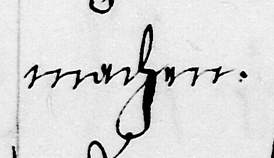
machen.
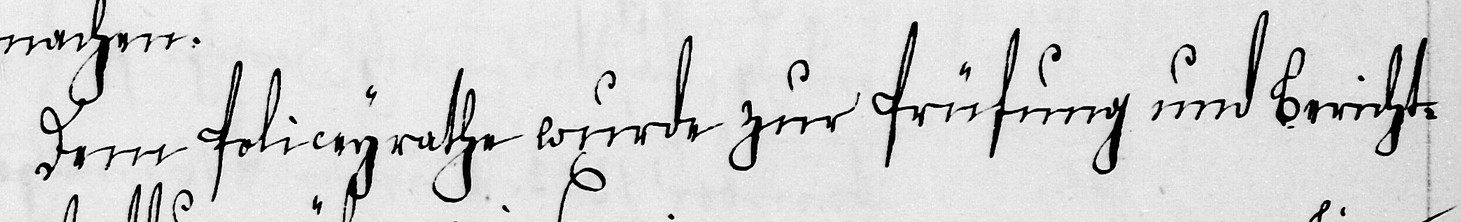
Dem Policeyrathe wurde zur Prüfung und Bericht¬
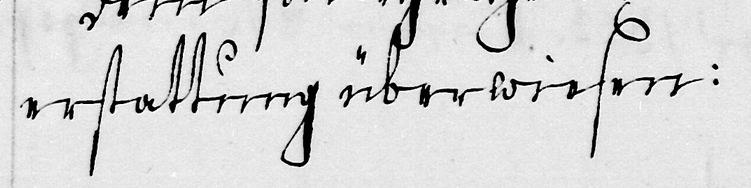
erstattung überwiesen:
